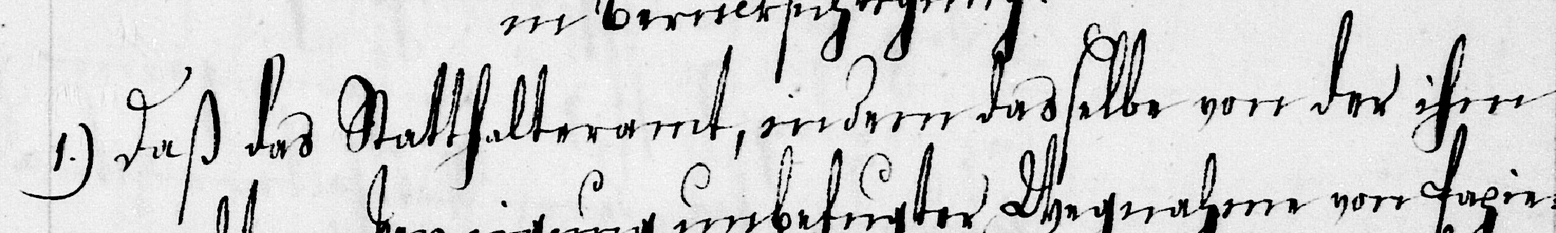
1.) Daß das Statthalteramt, indem dasselbe von der ihm
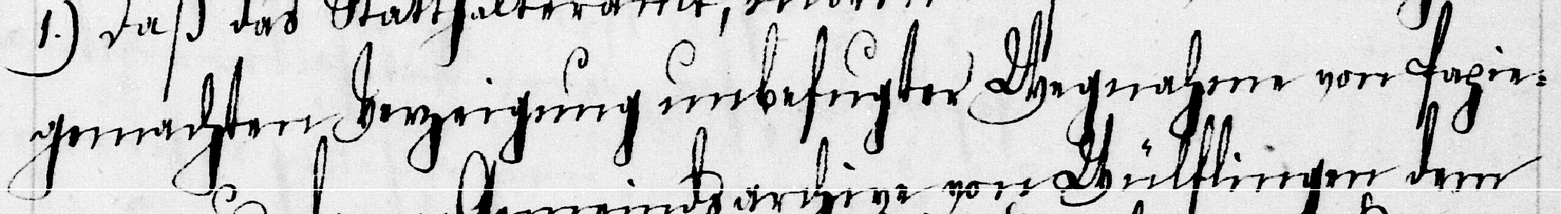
gemachten Verzeigung unbefugter Wegnahme von Papie¬
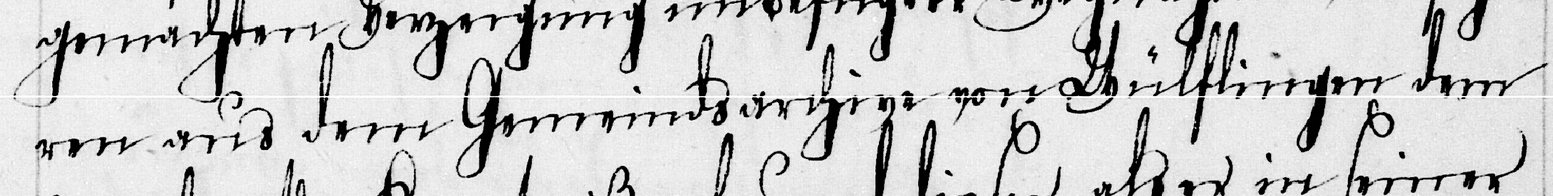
ren aus dem Gemeindsarchive von Wülflingen dem
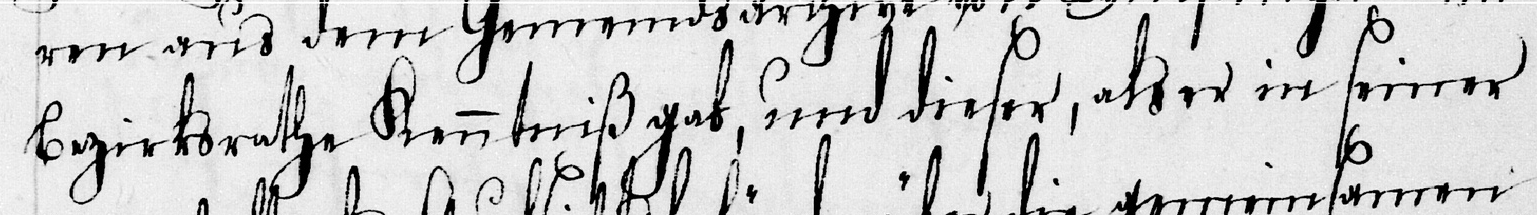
Bezirksrathe Kenntniß gab, und dieser, als er in seiner
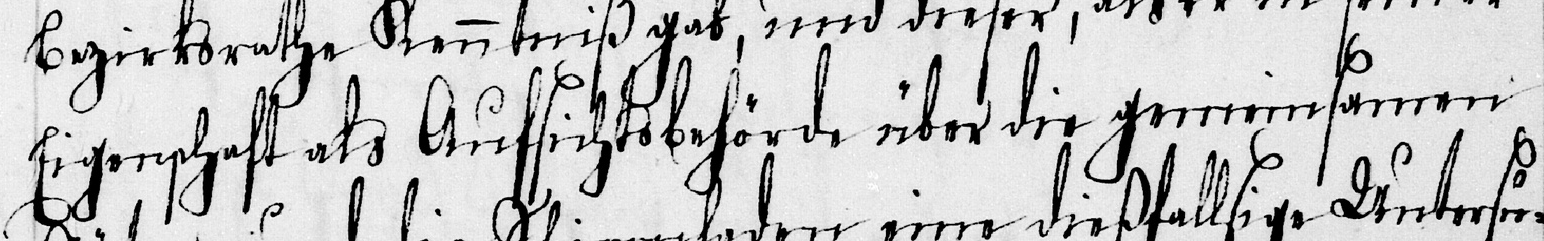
Eigenschaft als Aufsichtsbehörde über die gemeinsamen
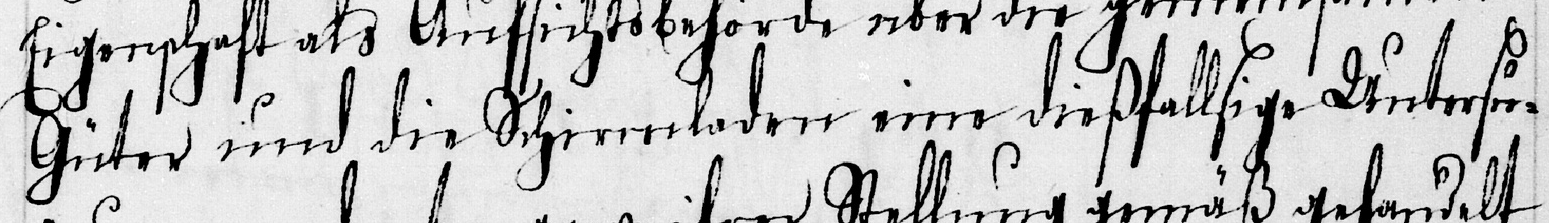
Güter und die Schirmladen eine dießfallige Untersu¬
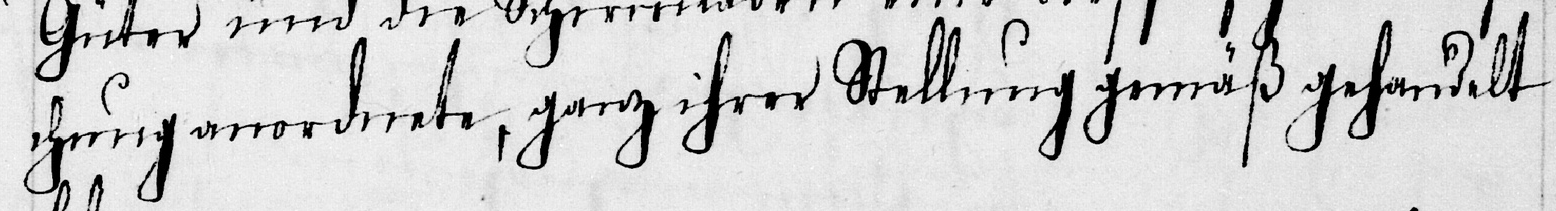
chung anordnete, ganz ihrer Stellung gemäß gehandelt
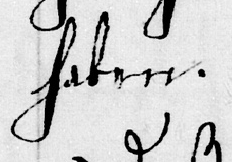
haben.
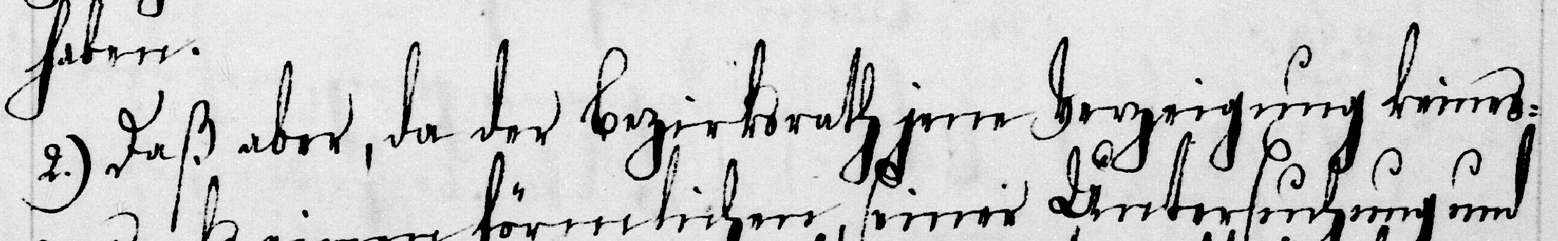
2.) Daß aber, da der Bezirksrath jene Verzeigung keines¬
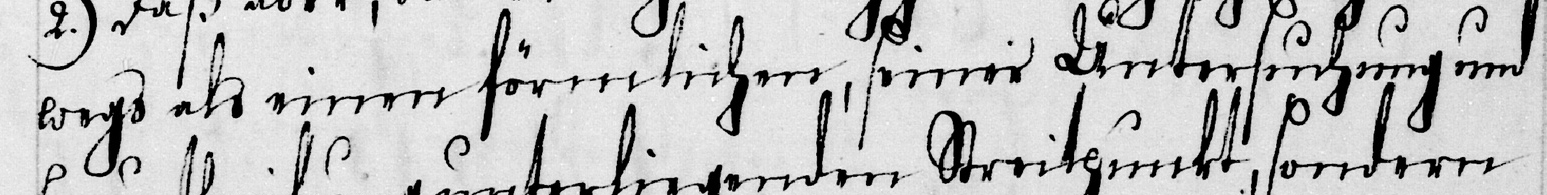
wegs als einen förmlichen, seiner Untersuchung und
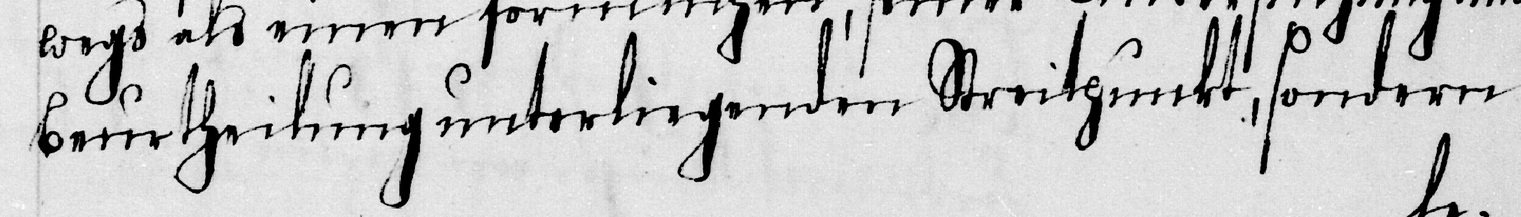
Beurtheilung unterliegenden Streitpunkt, sondern
